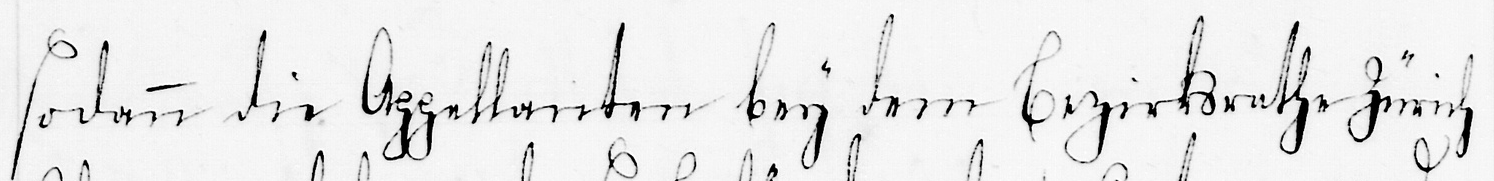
sodann die Appellanten bey dem Bezirksrathe Zürich
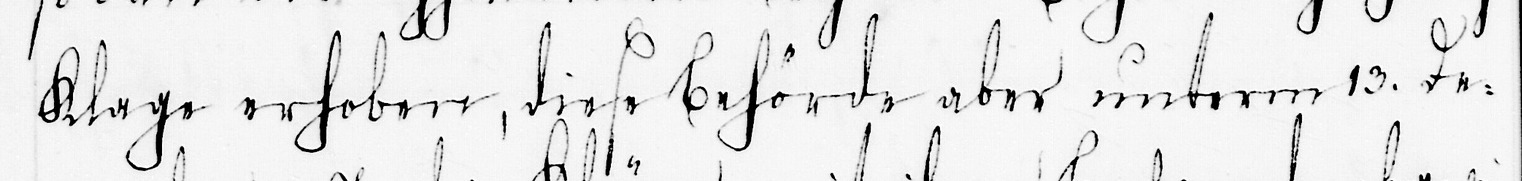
Klage erhoben, diese Behörde aber unterm 13. De¬
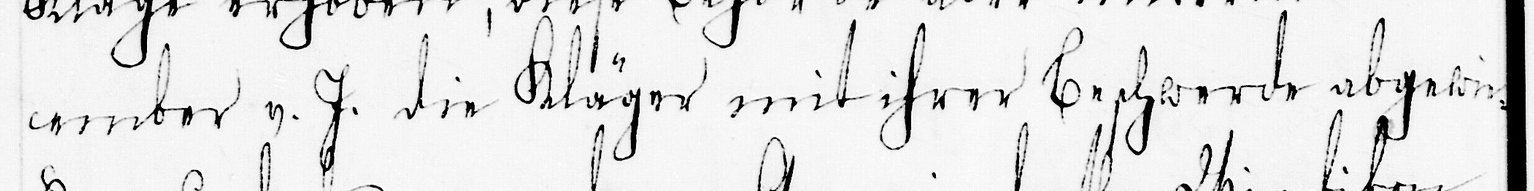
cember v. J. die Kläger mit ihrer Beschwerde abgewie¬
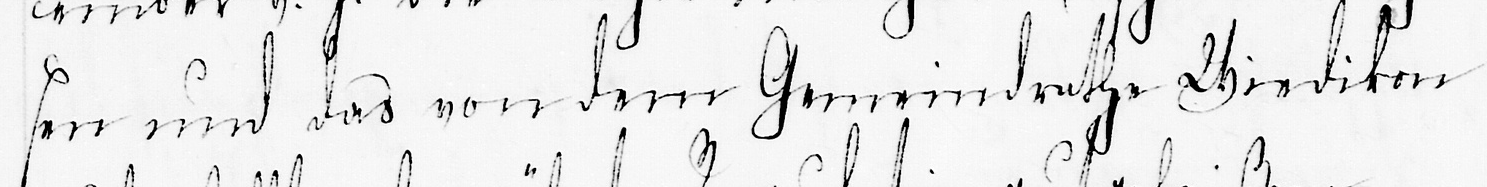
sen und das von dem Gemeindrathe Wiedikon
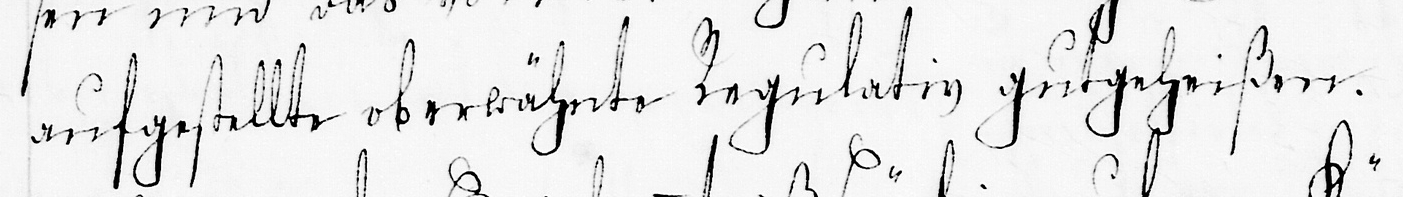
aufgestellte oberwähnte Regulativ gutgeheißen.
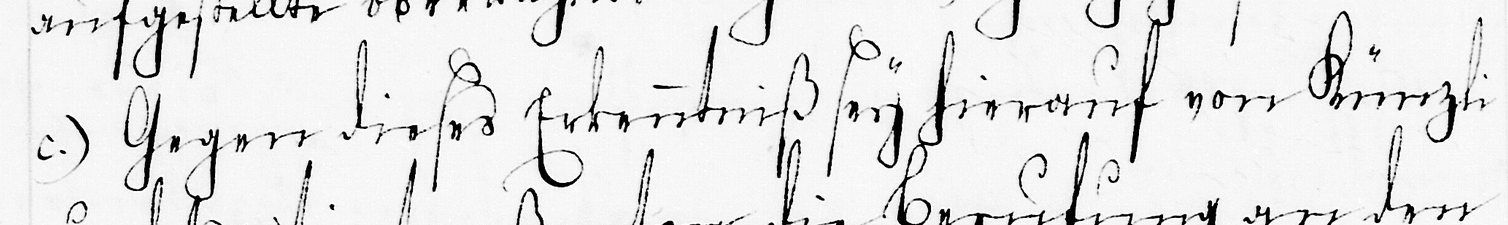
c.) Gegen dieses Erkenntniß sey hierauf von Künzli
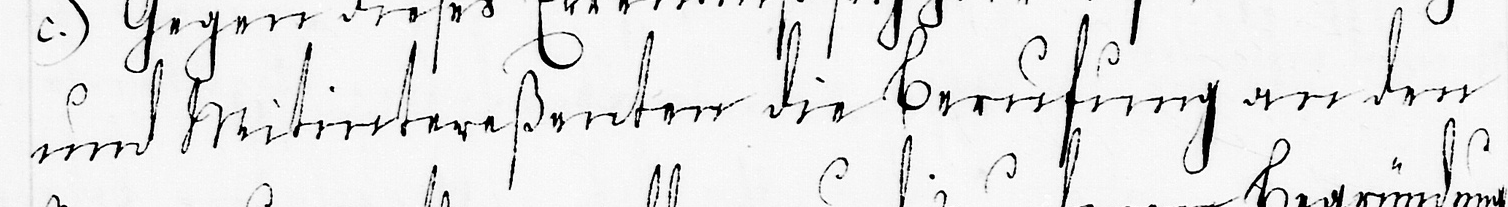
und Mitintereßenten die Berufung an den
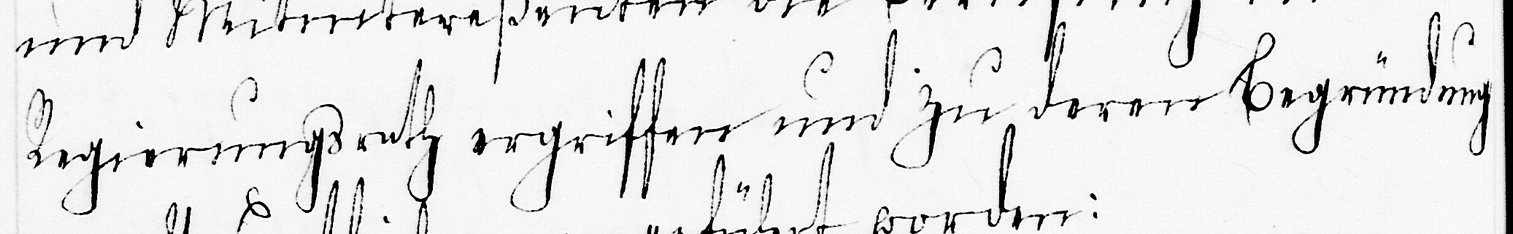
Regierungsrath ergriffen und zu deren Begründung
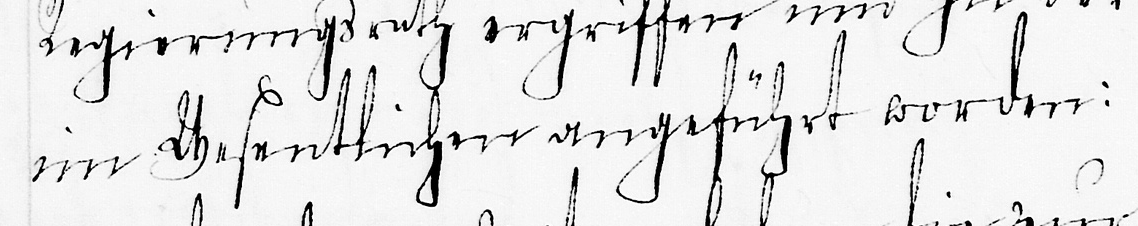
im Wesentlichen angeführt worden:
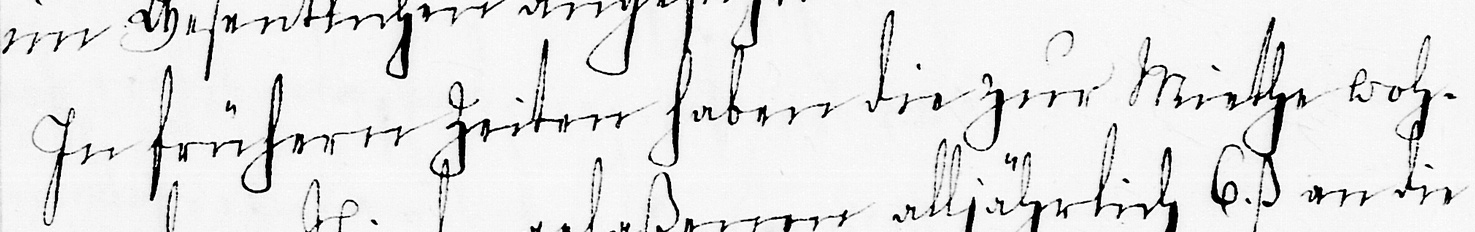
In frühern Zeiten haben die zur Miethe woh¬
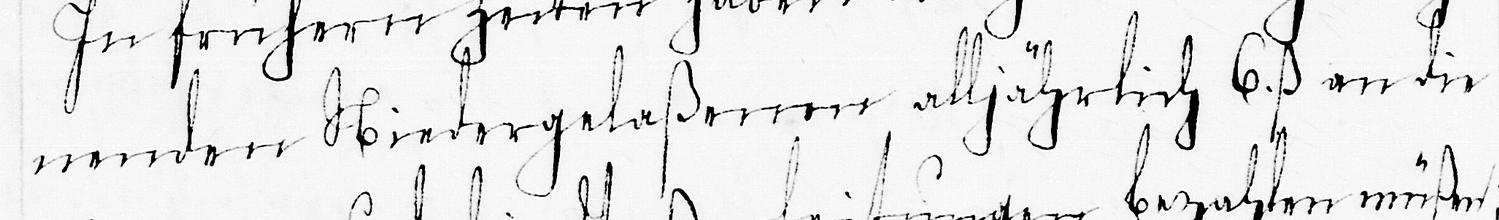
nenden Niedergelaßenen alljährlich 6. ß. an die
